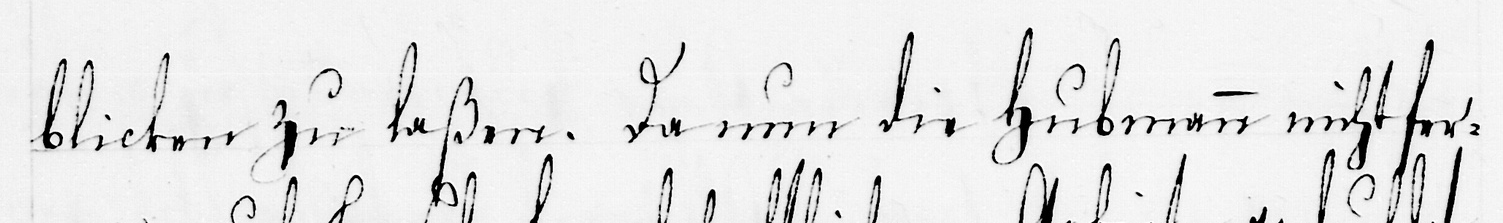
blicken zu laßen. Da nun die Hubmann nicht fe¬
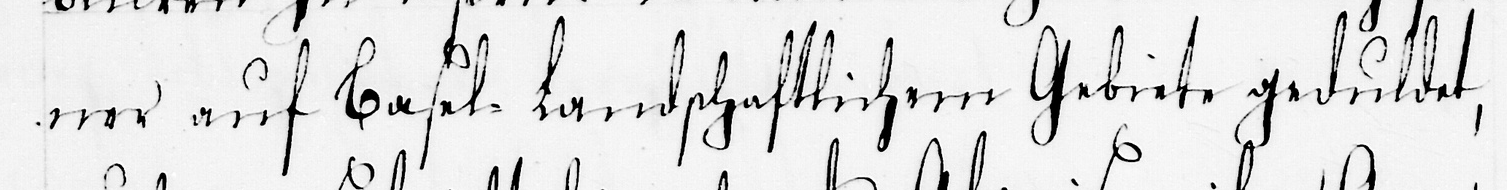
rner auf Basel-Landschaftlichem Gebiete geduldet,
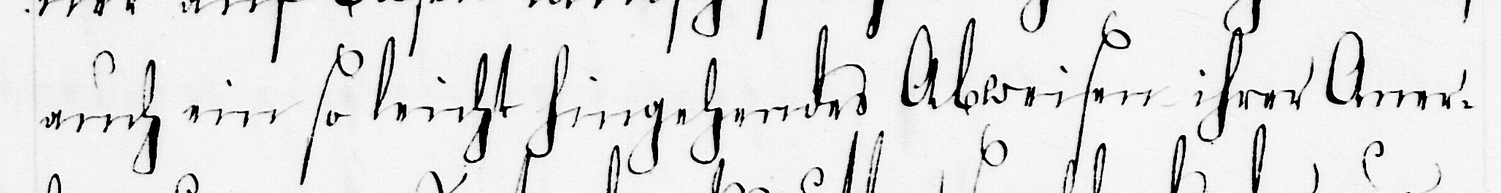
auch ein so leicht hingehendes Abweisen ihrer Aner¬
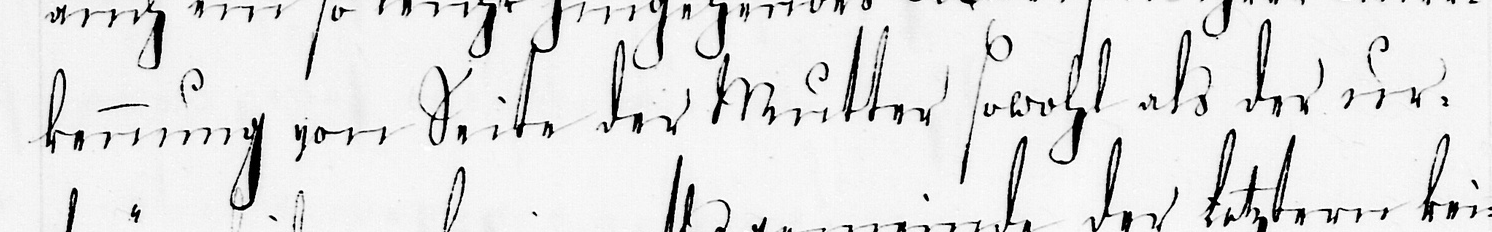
kennung von Seite der Mutter sowohl als der ur¬
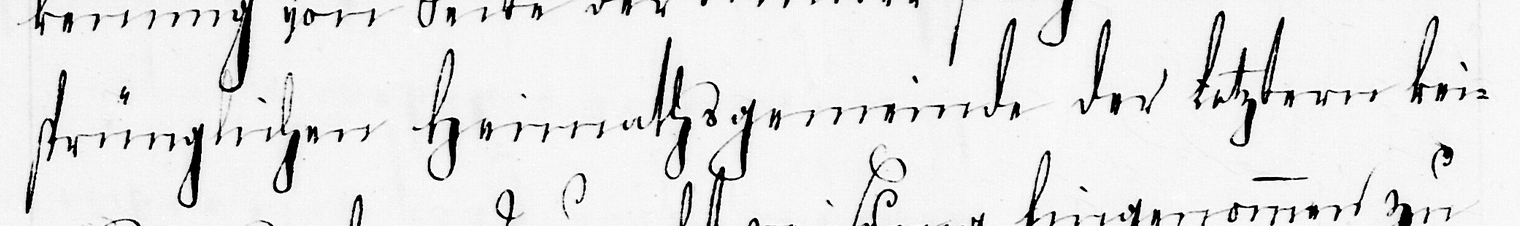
sprünglichen Heimathsgemeinde der Letztern kei¬
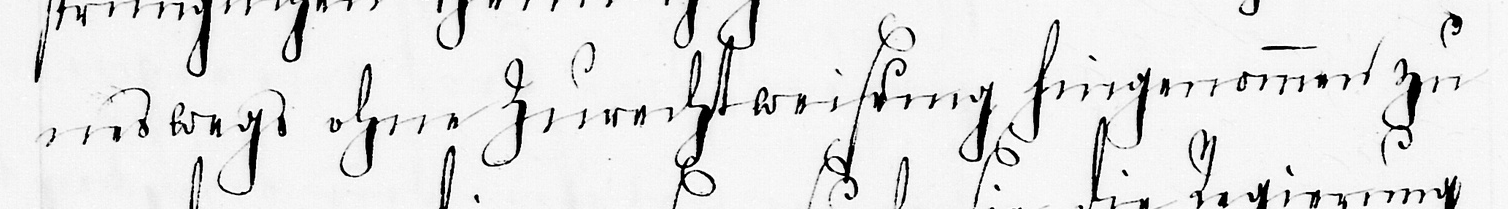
neswegs ohne Zurechtweisung hingenommen zu
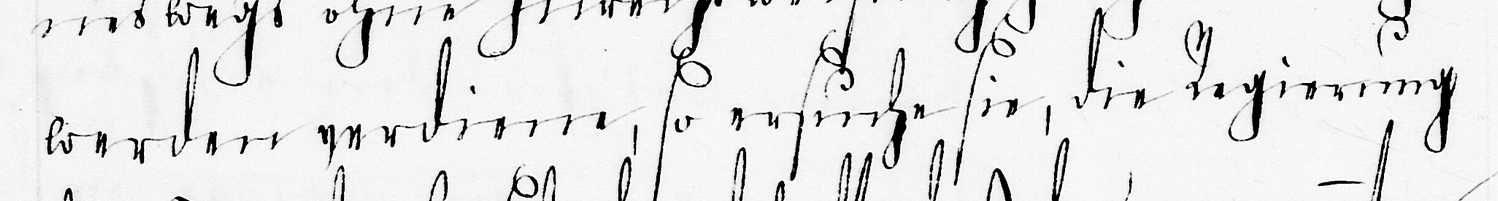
werden verdiene, so ersuche sie, die Regierung
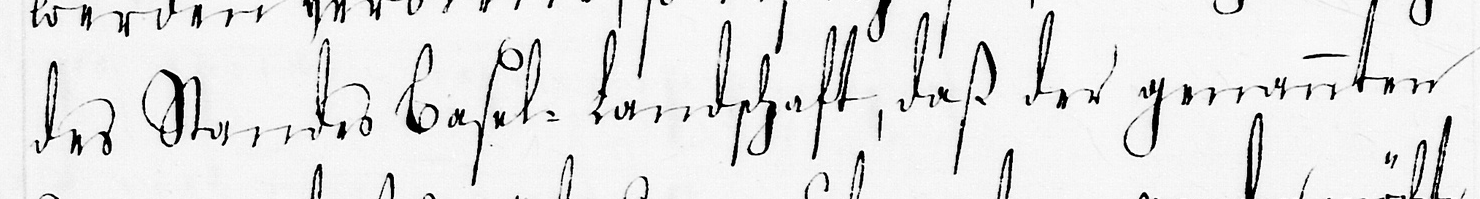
des Standes Basel-Landschaft, daß der genannten
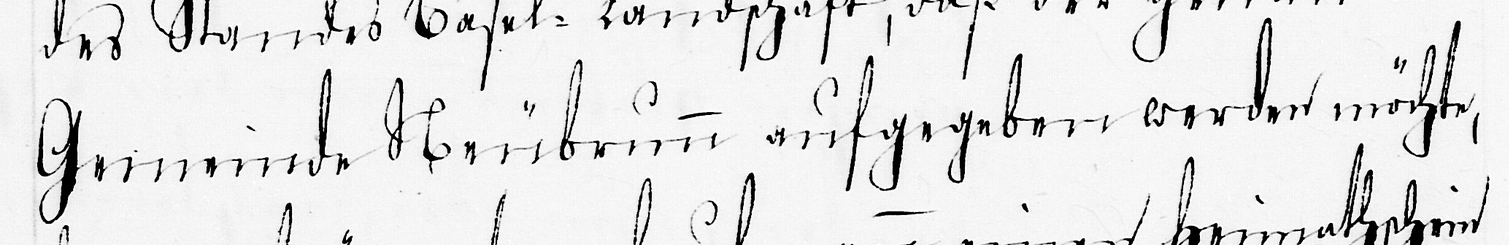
Gemeinde Neubrunn aufgegeben werden möchte,
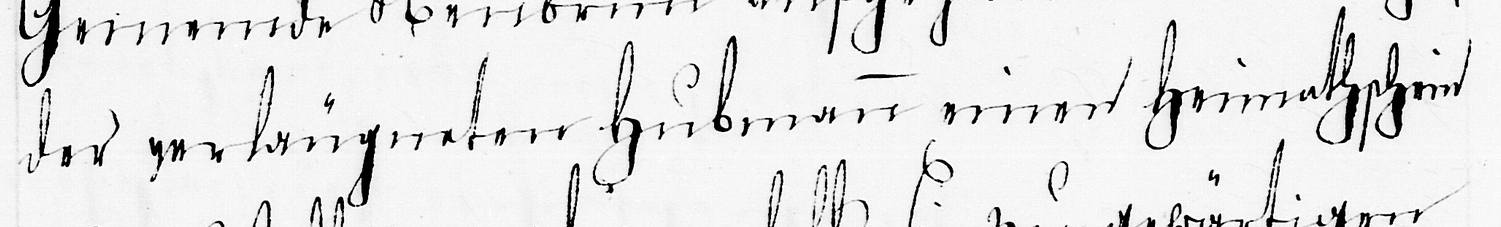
der verleugneten Hubmann einen Heimathschein
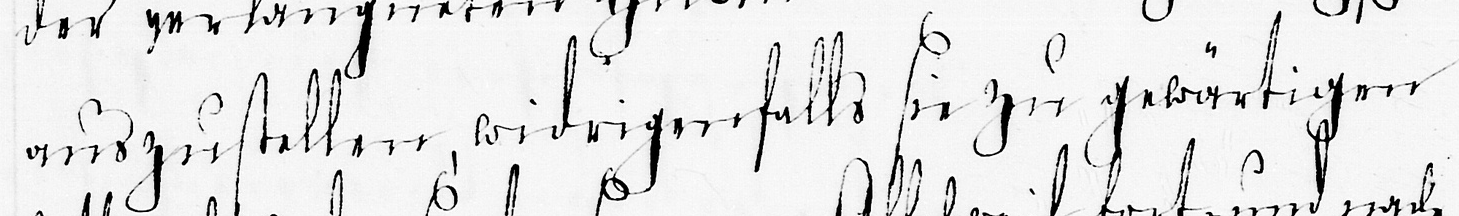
auszustellen, widrigenfalls sie zu gewärtigen
